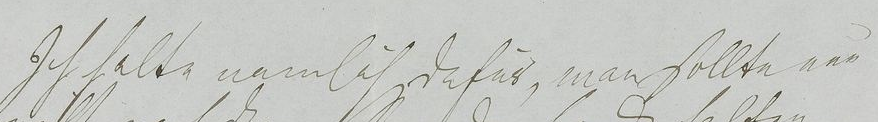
Ich halte nämlich dafür, man sollte nun
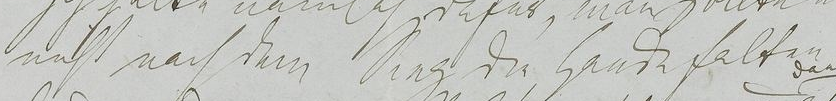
nicht nach dem Sieg die Hände falten
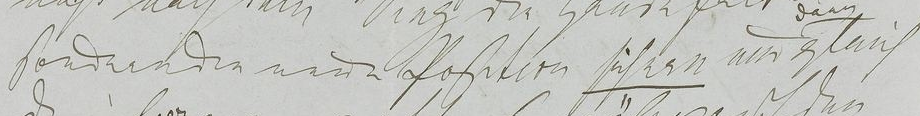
sondern die neue Position sichern und dann gleich
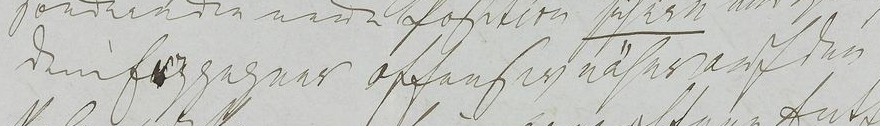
dem Erzgegner offensiv näher auf den
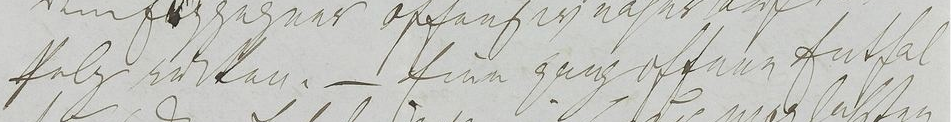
Pelz rücken. – Eine ganz offene Entfal-
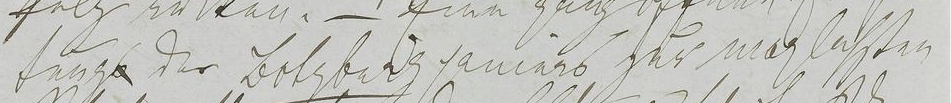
tung des Bötzberg paniers zur möglichsten
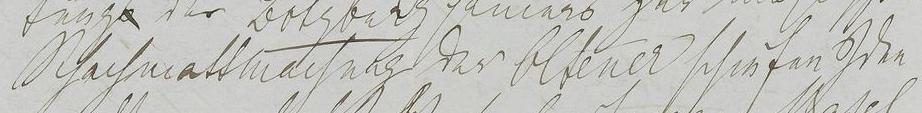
Schachmattmachung der Oltener schiefen Idee
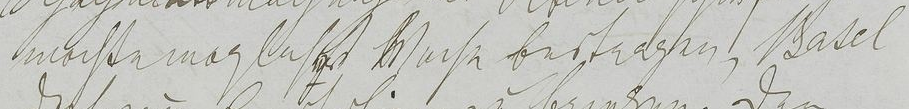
möchte möglicher Weise beitragen, Basel
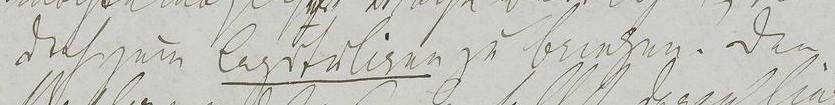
doch zum Capituliren zu bringen. Den
